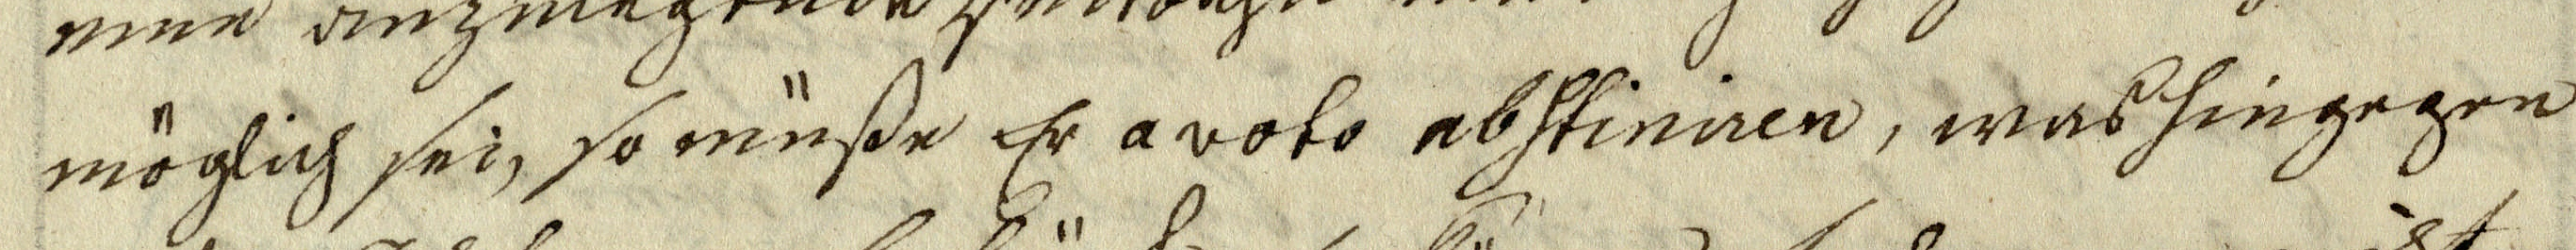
möglich sei, so müße Er a voto abstiniren, was hingegen,
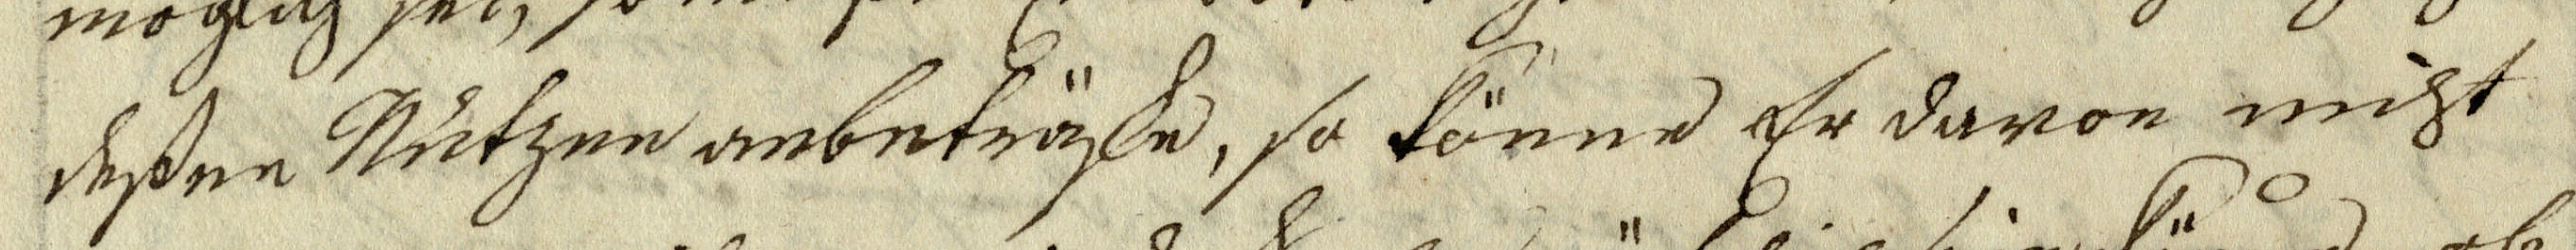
deßen Nutzen anbeträfe, so könne Er davon nicht
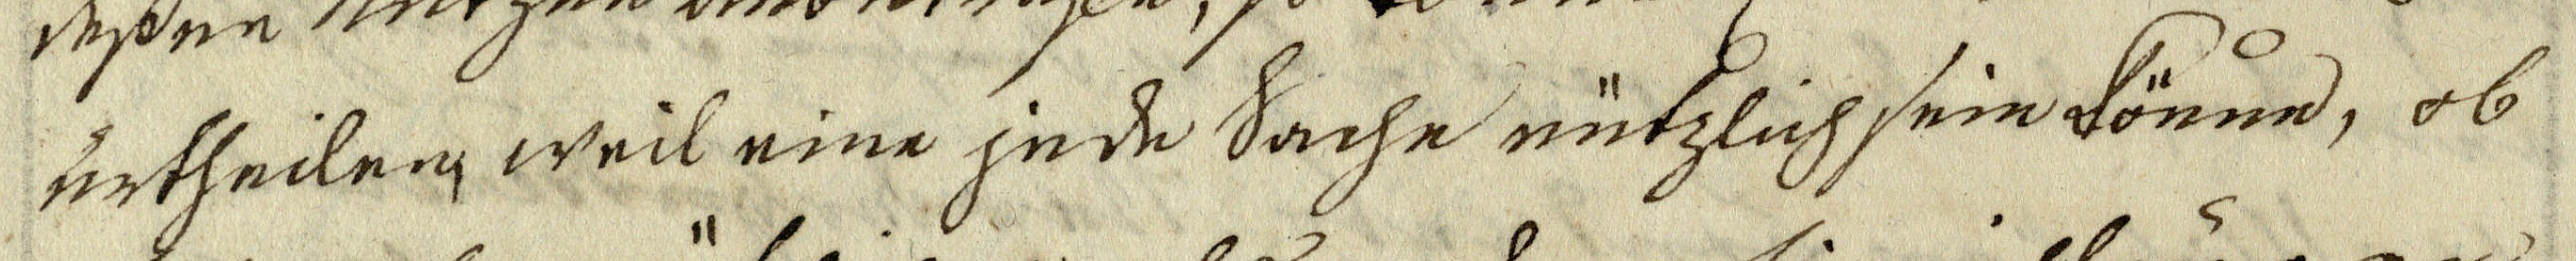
urtheilen, weil eine jede Sache nützlich sein könne, ob
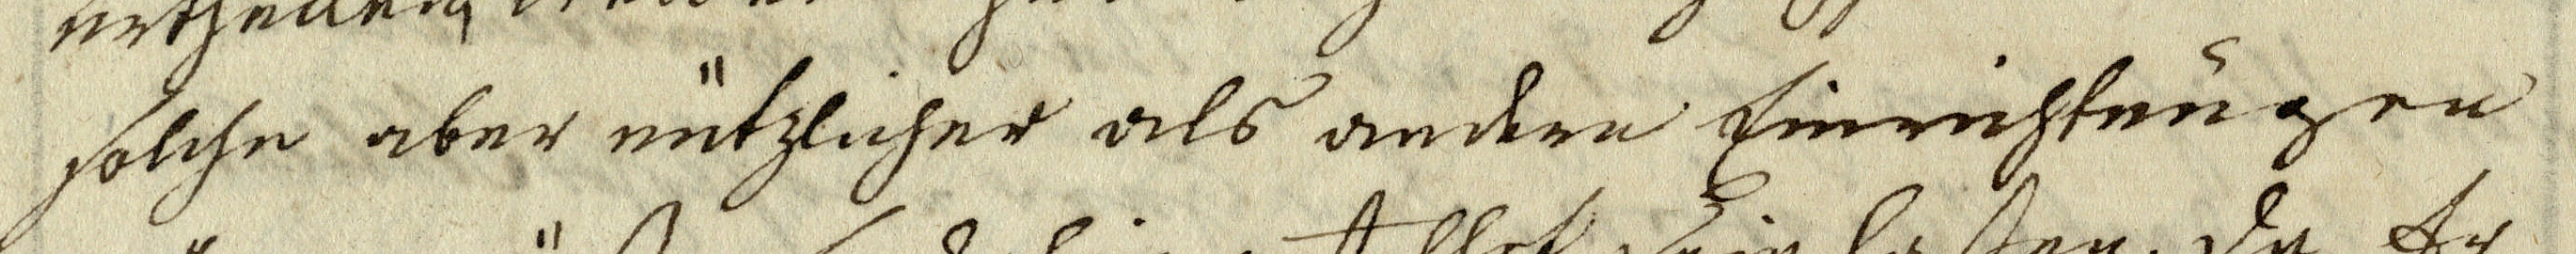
solche aber nützlicher als andere Einrichtungen
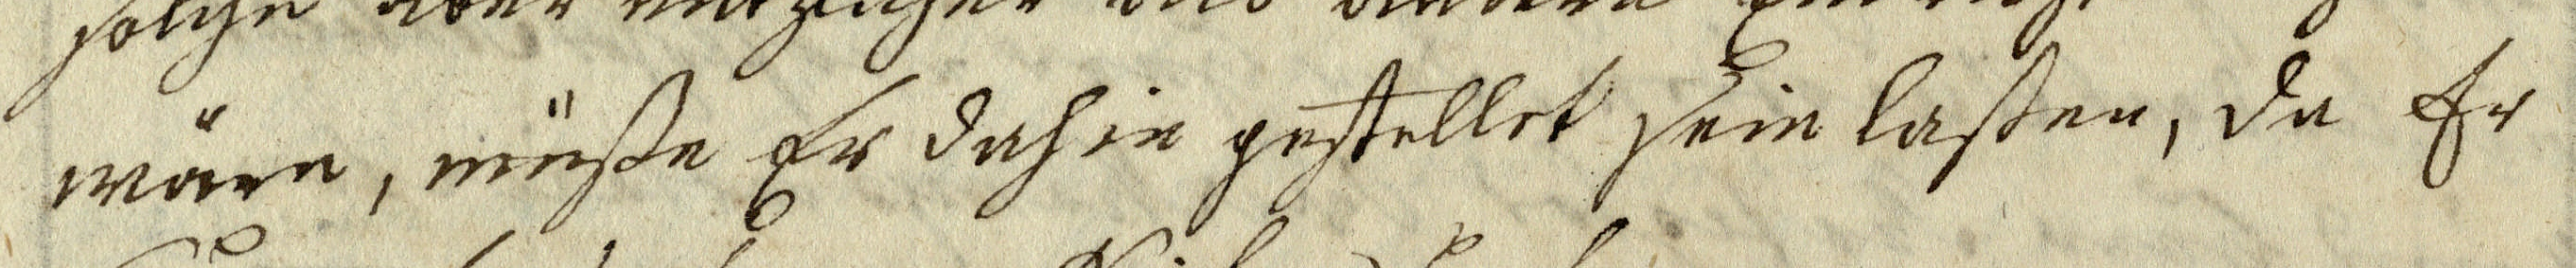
wäre, müße Er dahin gestellet sein laßen, da Er
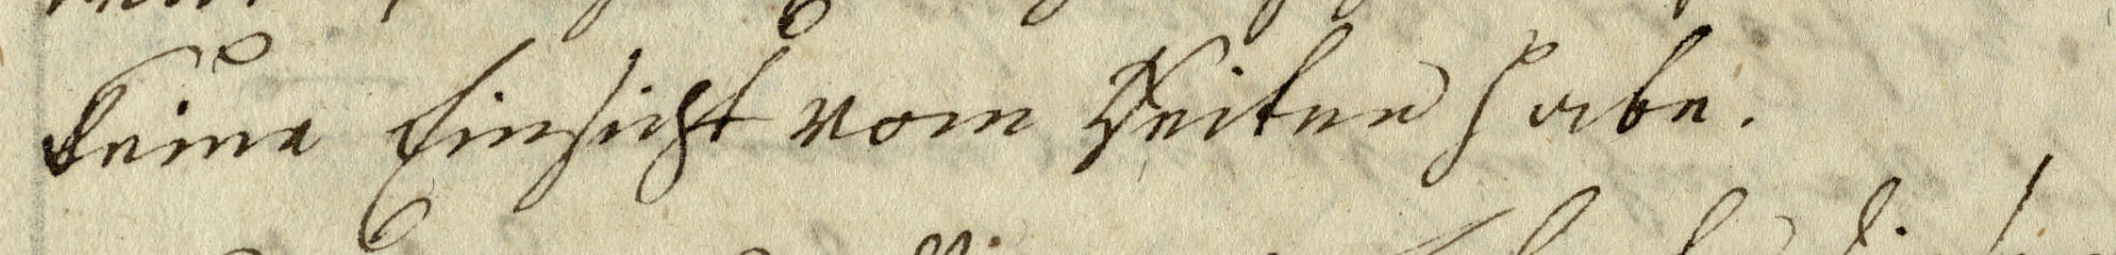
keine Einsicht vom Reiten habe.
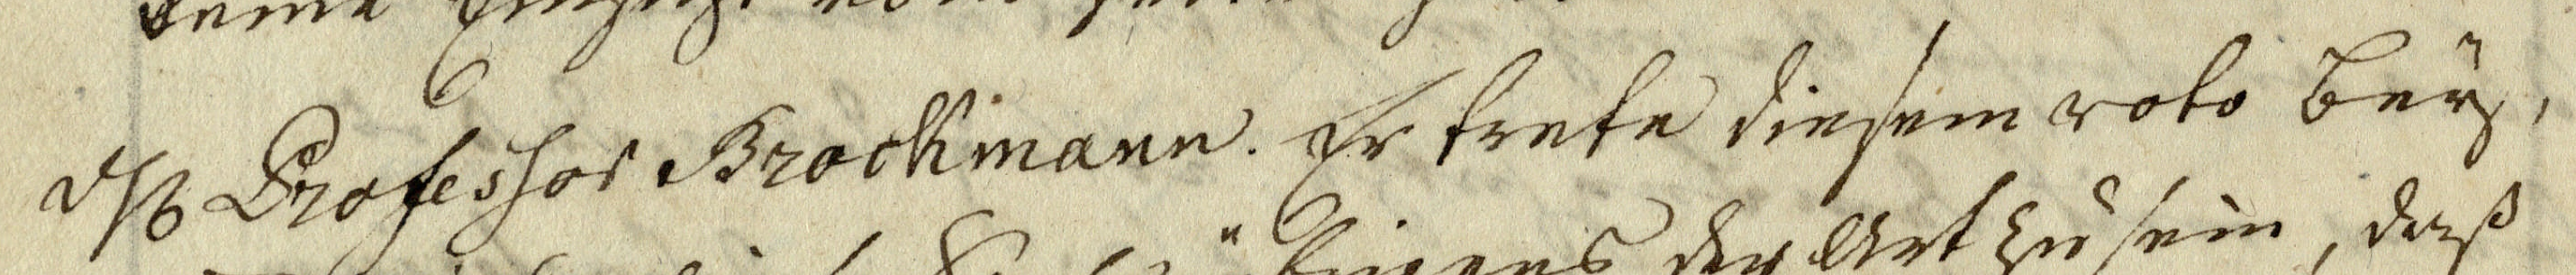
dh Professor Brockmann. Er trete diesem voto beÿ,
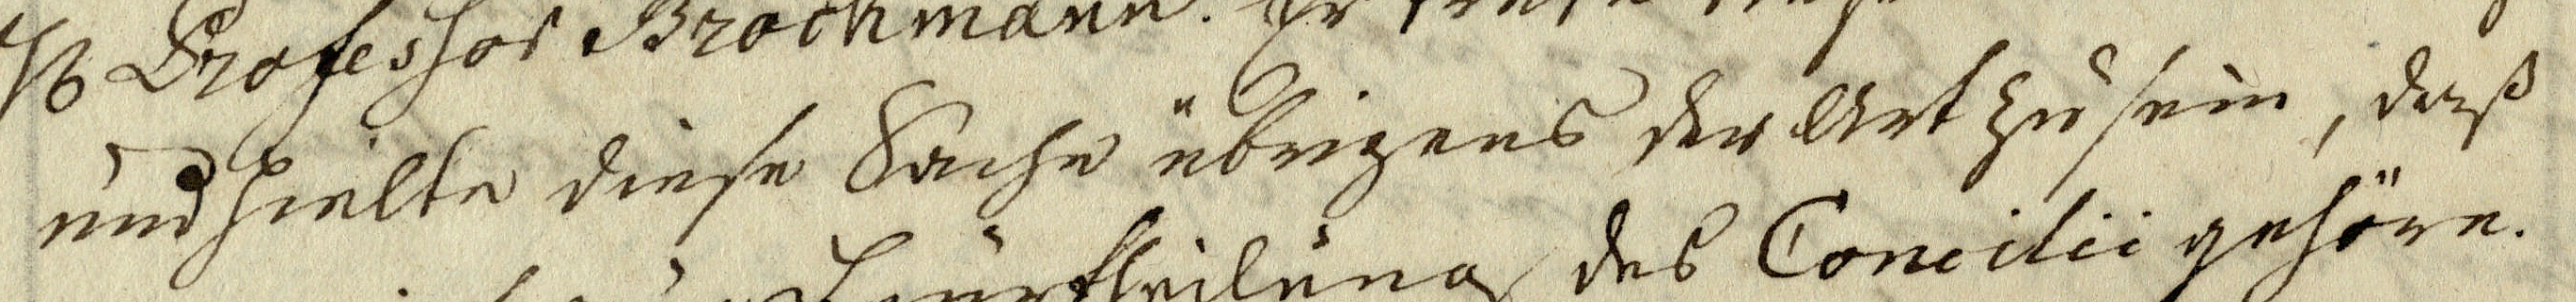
und hielte diese Sache übrigens der Art zu sein, daß
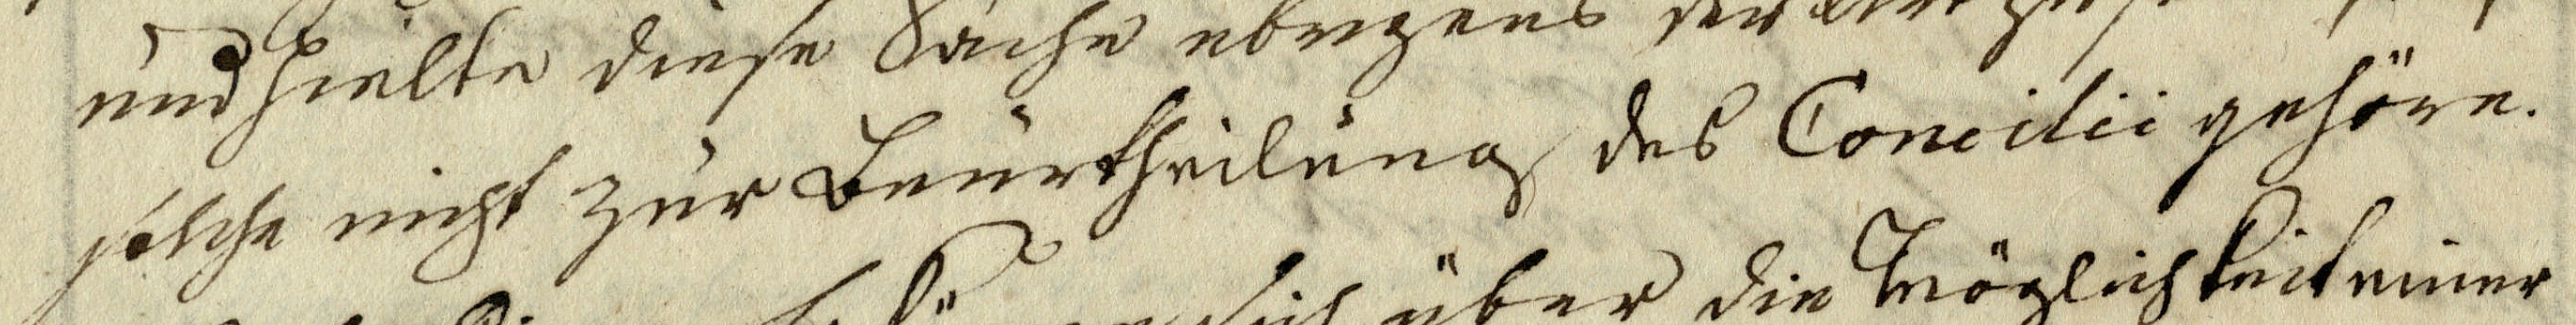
solche nicht zur Beurtheilung des Concilii gehöre.
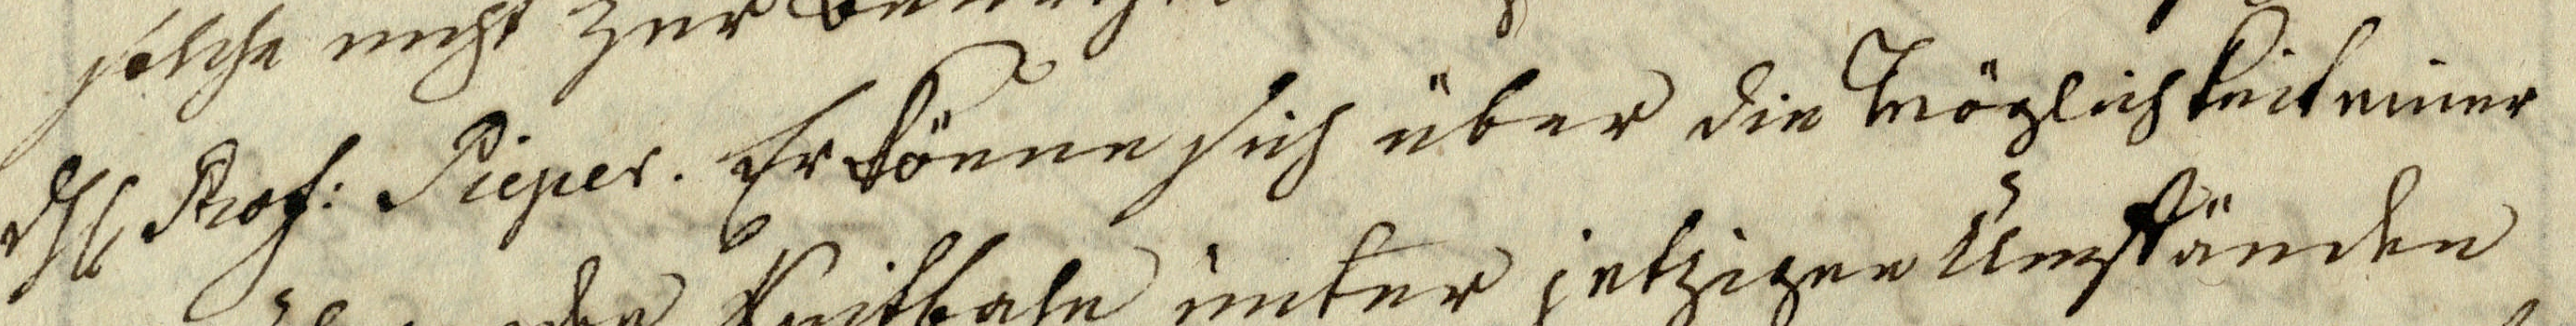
dh Prof. Pieper. Er könne sich über die Möglichkeit einer
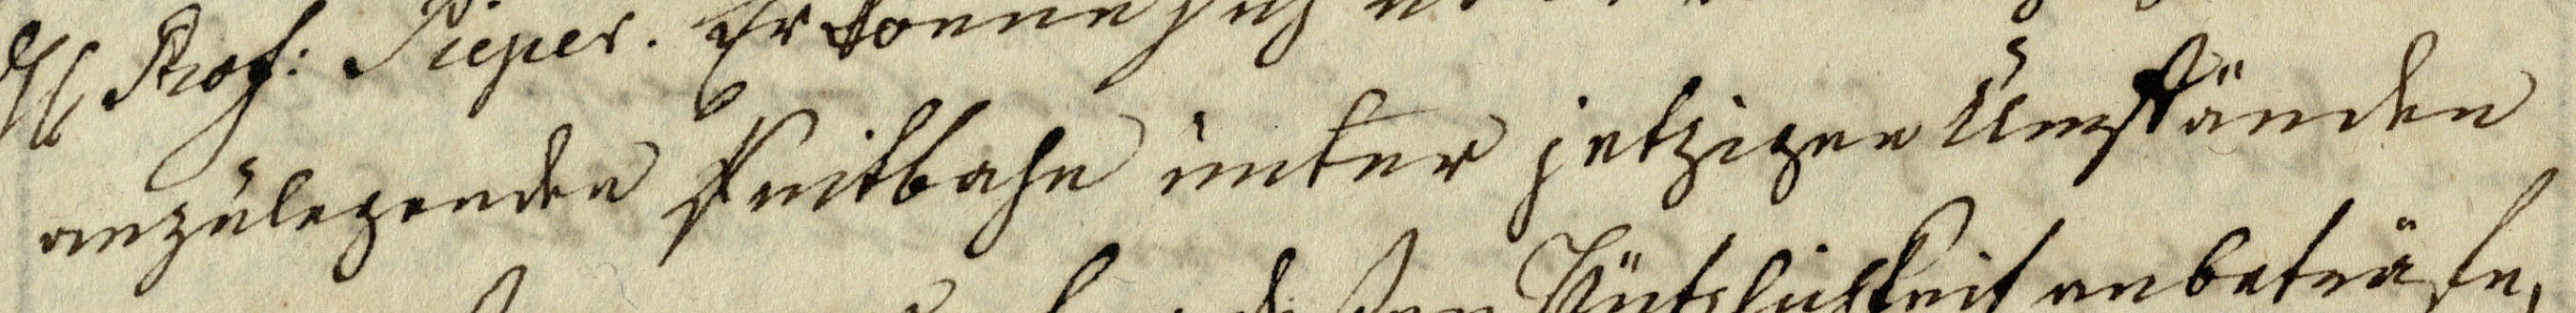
anzulegenden Reitbahn unter jetzigen Umständen
